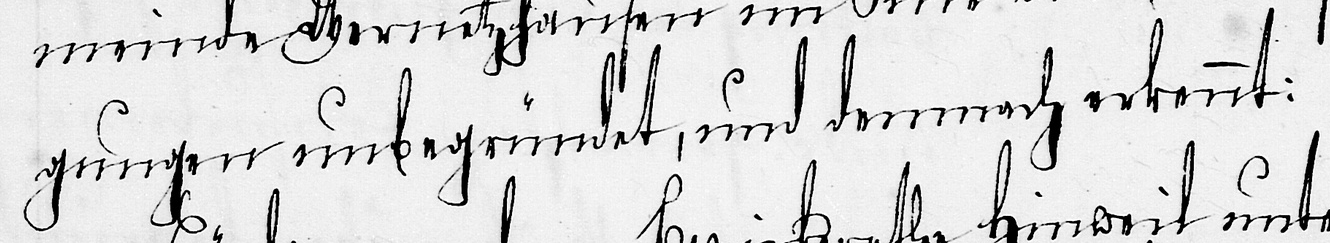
gungen unbegründet, und demnach erkennt:
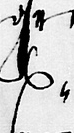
1.)
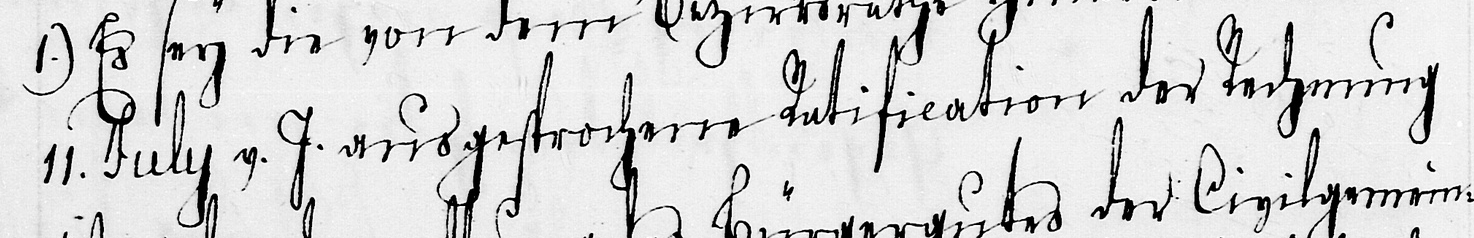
v. J. ausgeprochene Ratification der Rechnung
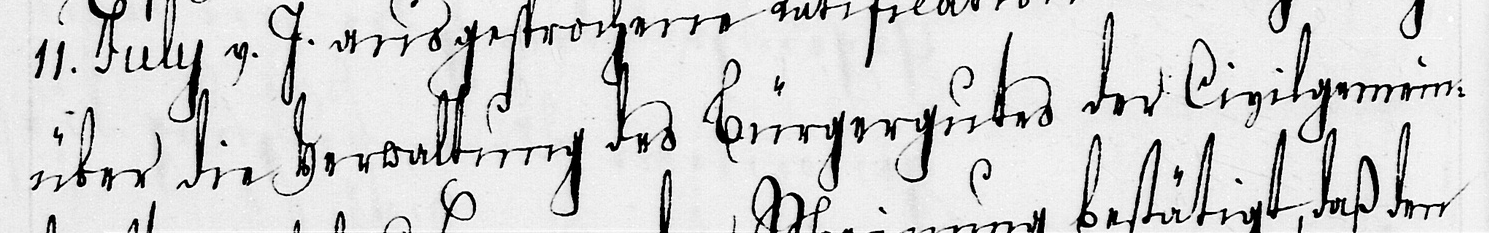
über die Verwaltung des Bürgergutes der Civilgemein¬
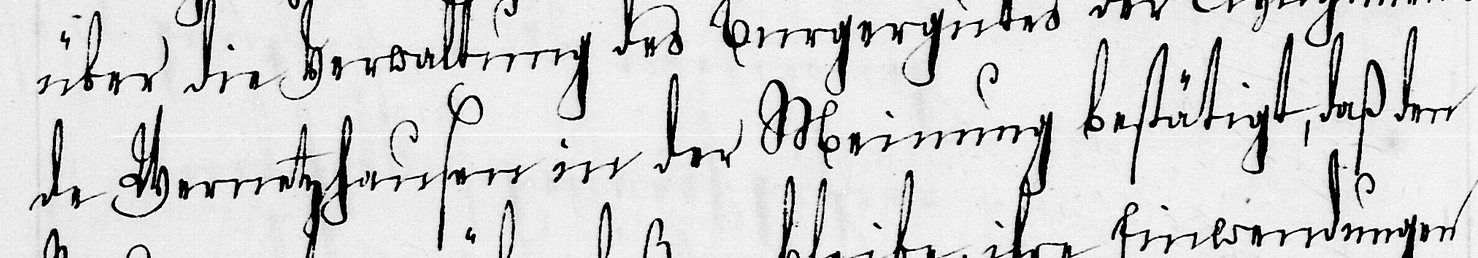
de Wernetzhausen in der Meinung bestätigt, daß den
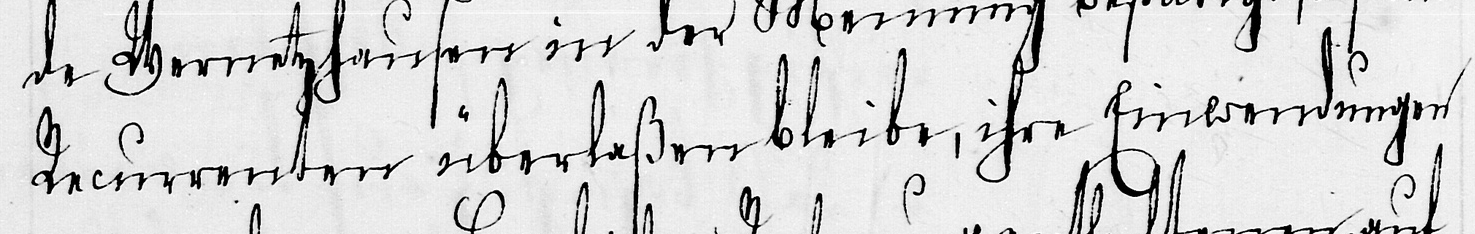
Recurrenten überlaßen bleibe, ihre Einwendungen
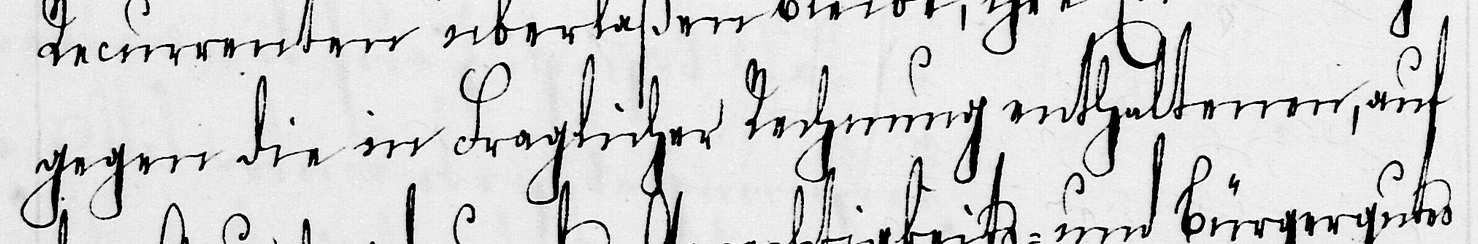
gegen die in Fraglicher Rechnung enthaltenen, auf
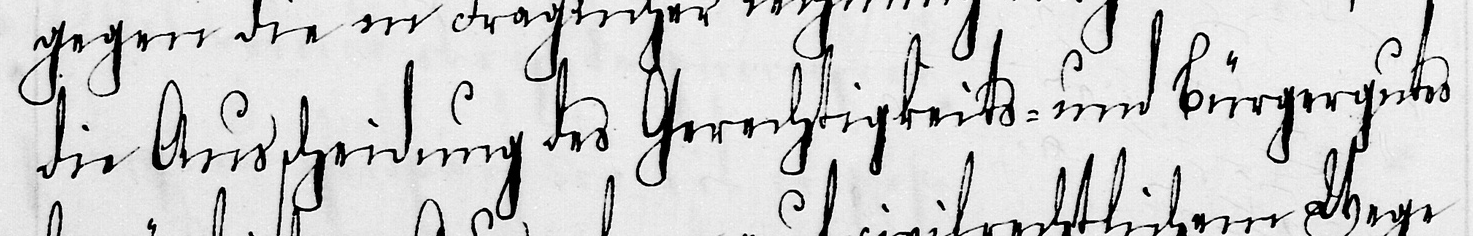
die Ausscheidung des Gerechtigkeits- und Bürgergutes
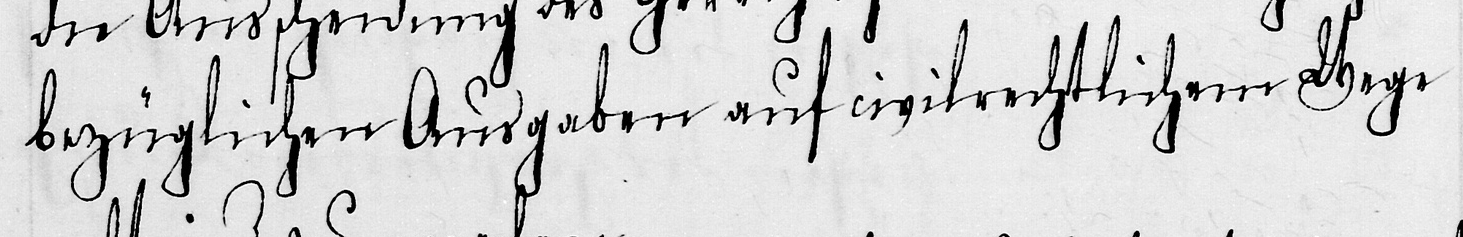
bezüglichen Ausgaben auf civilrechtlichem Wege
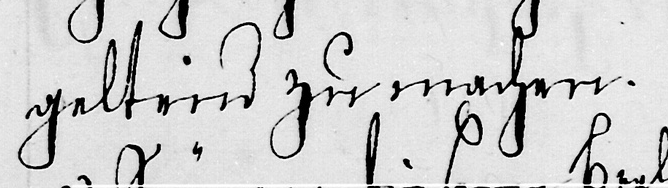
geltend zu machen.
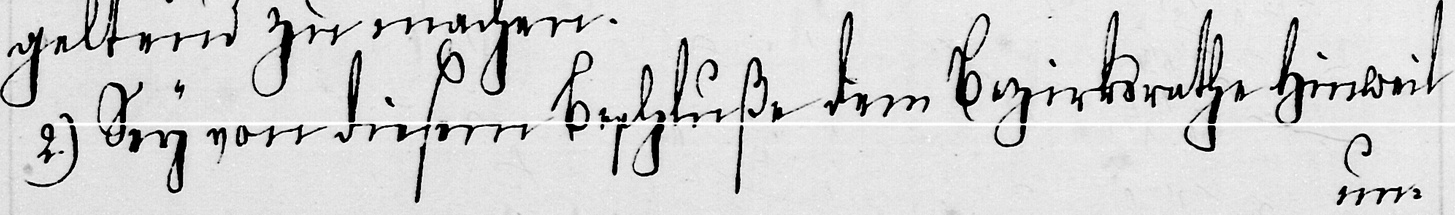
2.) Sey von diesem Beschluße dem Bezirksrathe Hinweil
